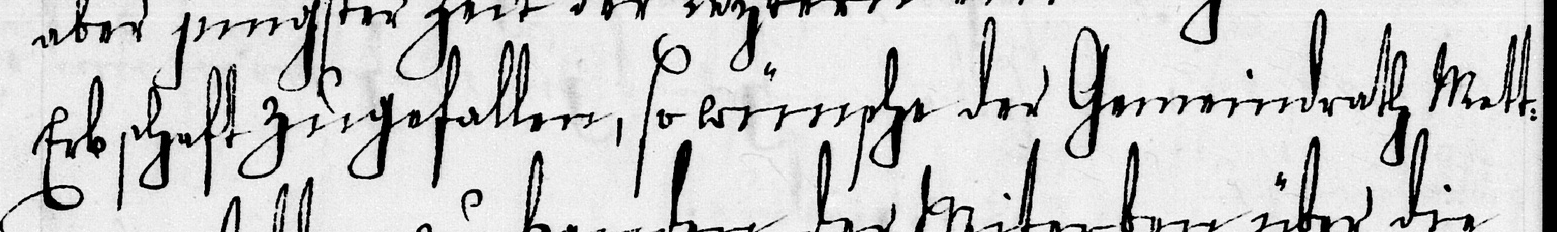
Erbschaft zugefallen, so wünsche der Gemeindrath Mett¬
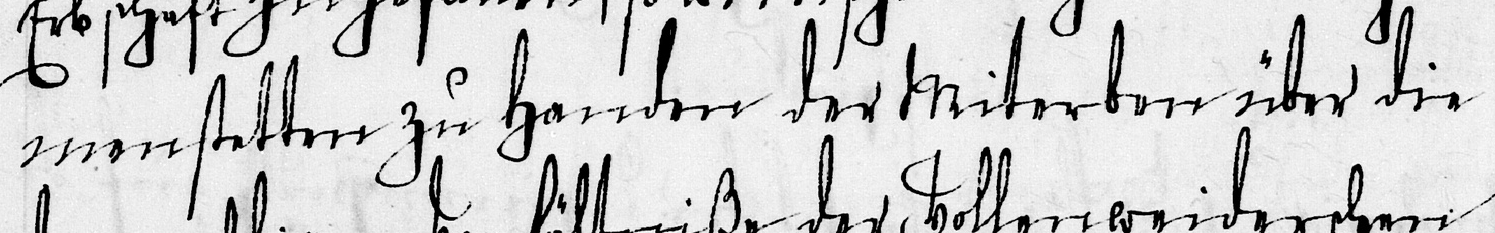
menstetten zu Handen der Miterben über die
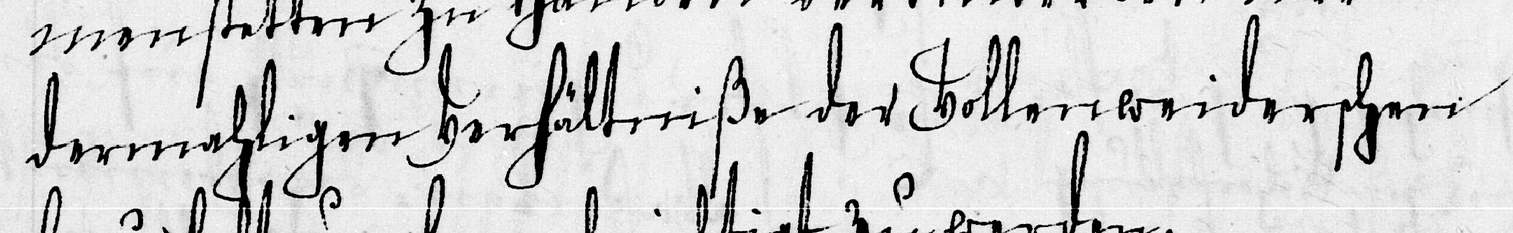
dermahligen Verhältniße der Vollenweiderschen
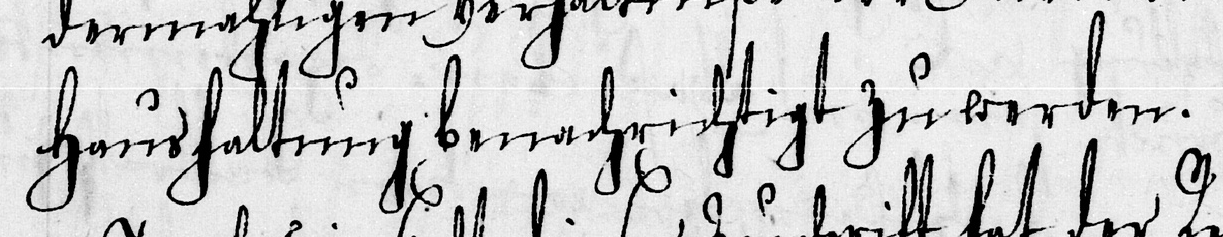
Haushaltung benachrichtigt zu werden.
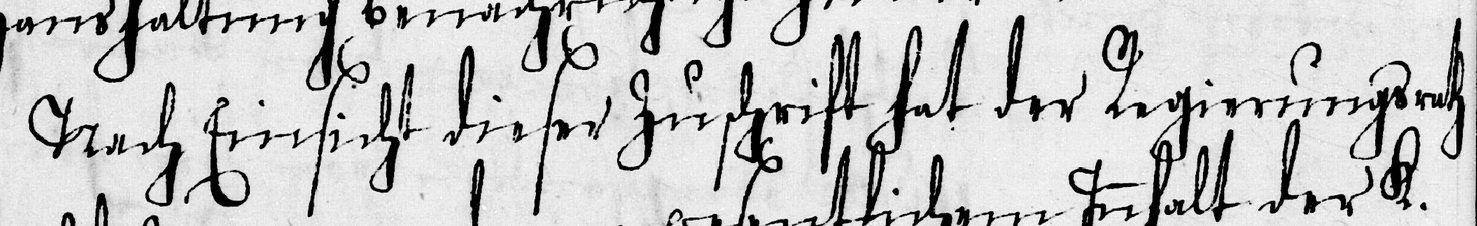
Nach Einsicht dieser Zuschrift hat der Regierungsrath
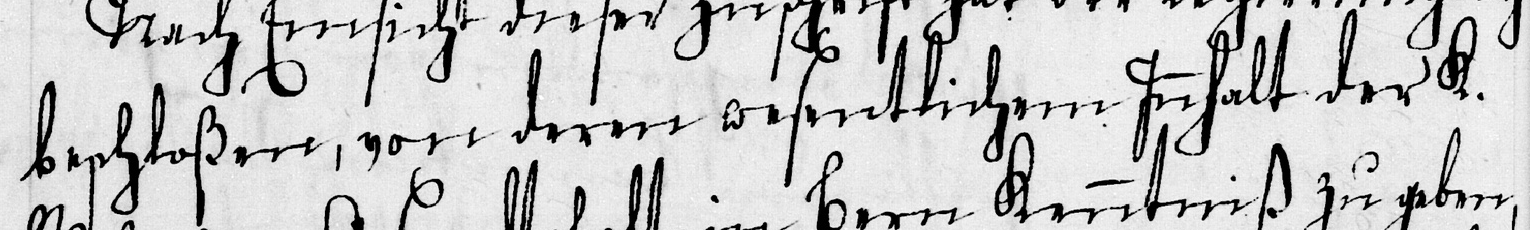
beschloßen, von deren wesentlichen Innhalt der K.
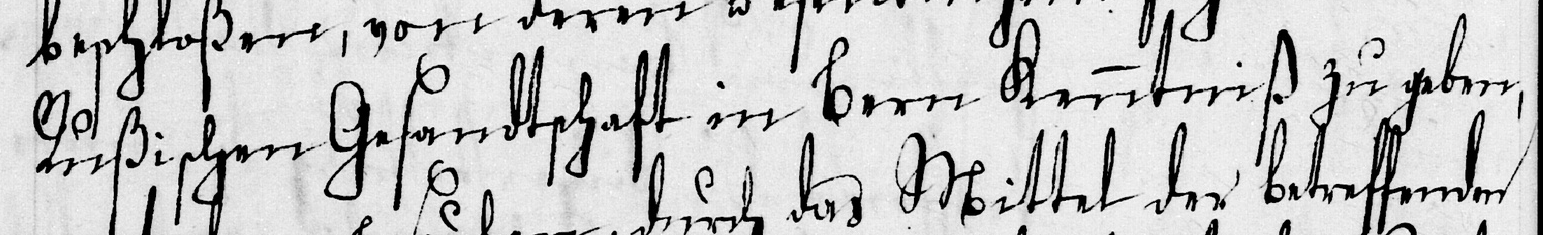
Rußischen Gesandtschaft in Bern Kenntniß zu geben,
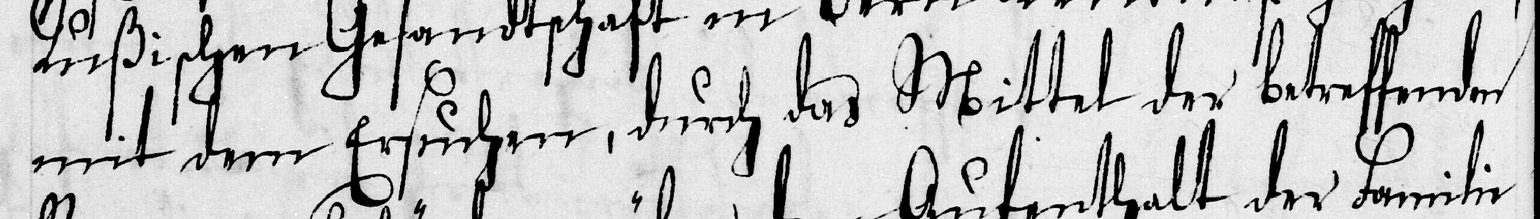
mit dem Ersuchen, durch das Mittel der betreffenden
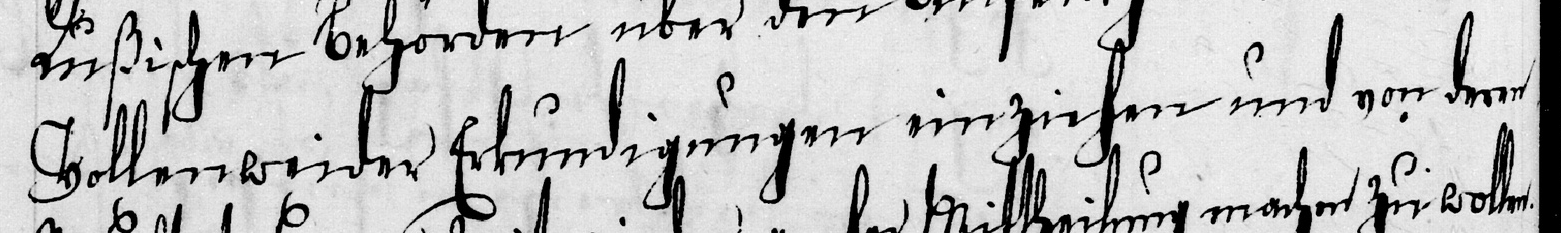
Vollenweider Erkundigungen einziehen und von deren
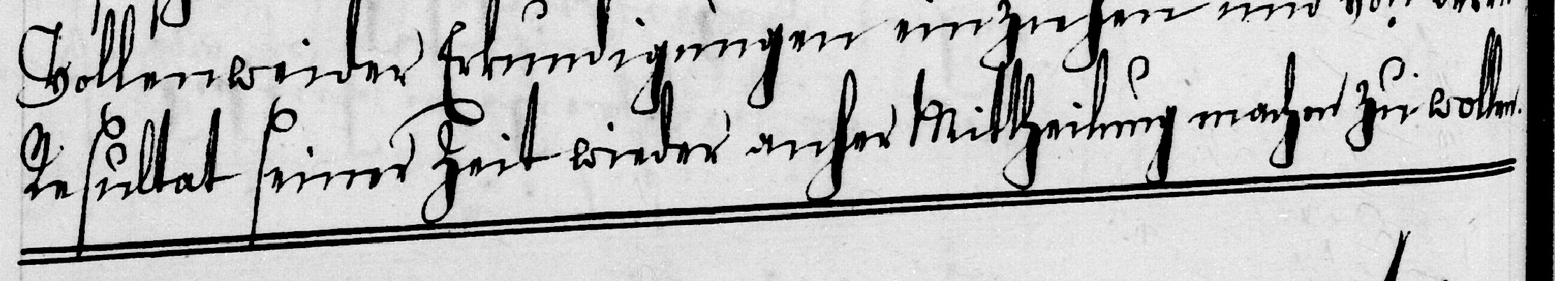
Resultat seiner Zeit wieder anher Mittheilung machen zu wol¬
